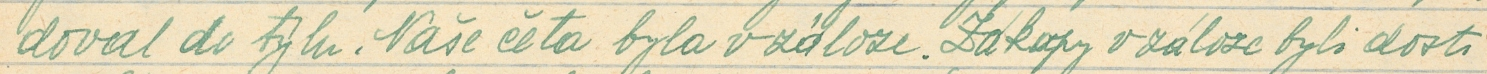doval do týlu. Naše četa byla v záloze. Zákopy v záloze byli dosti
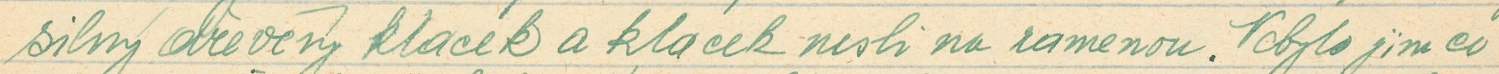silný dřevěný klacek a klacek nesli na ramenou. Nebylo jim co
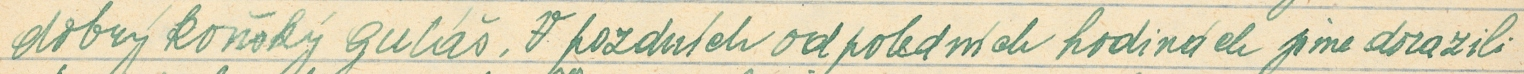dobrý koňský guláš. V pozdních odpoledních hodinách jsme dorazili
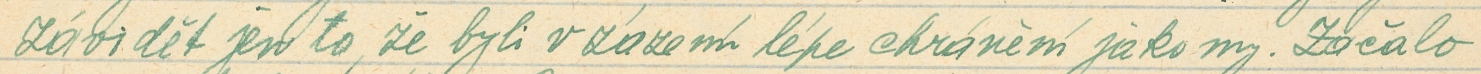závidět jen to, že byli v zázemí lépe chránění jako my. Začalo
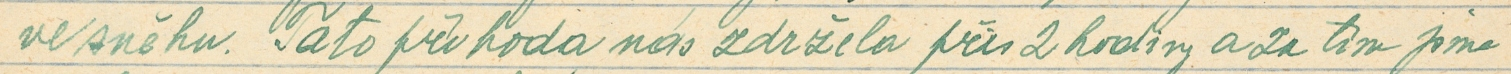ve sněhu. Tato příhoda nás zdržela přes 2 hodiny a za tím jsme
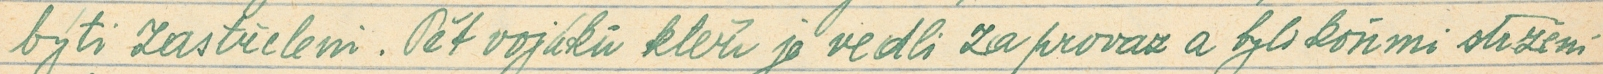býti zastřeleni. Pět vojáků kteří je vedli za provaz a byli koňmi stržení
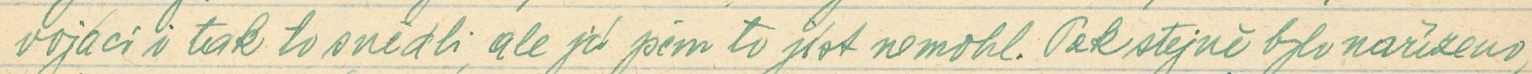vojáci i tak to snědli, ale já jsem to jíst nemohl. Pak stejně bylo nařízeno,
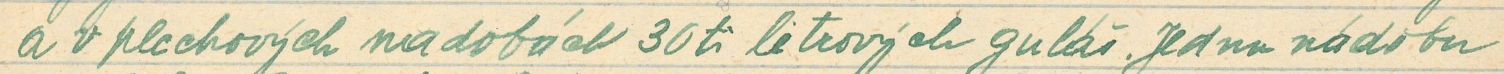a v plechových nádobách 30ti litrových guláš. Jednu nádobu
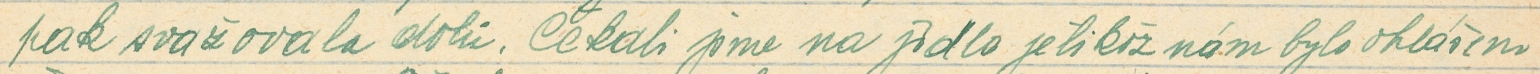pak svažovala dolů. Čekali jsme na jídlo jelikož nám bylo ohlášeno
